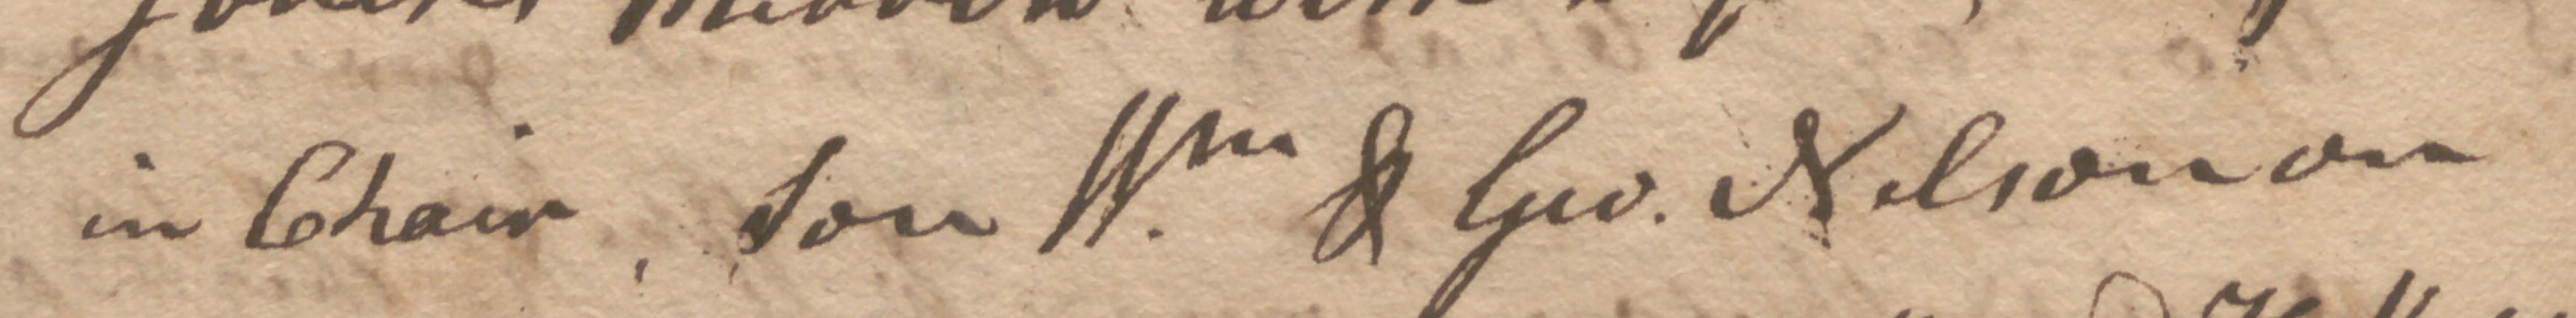in Chair son W^m. & Geo. Nelson on
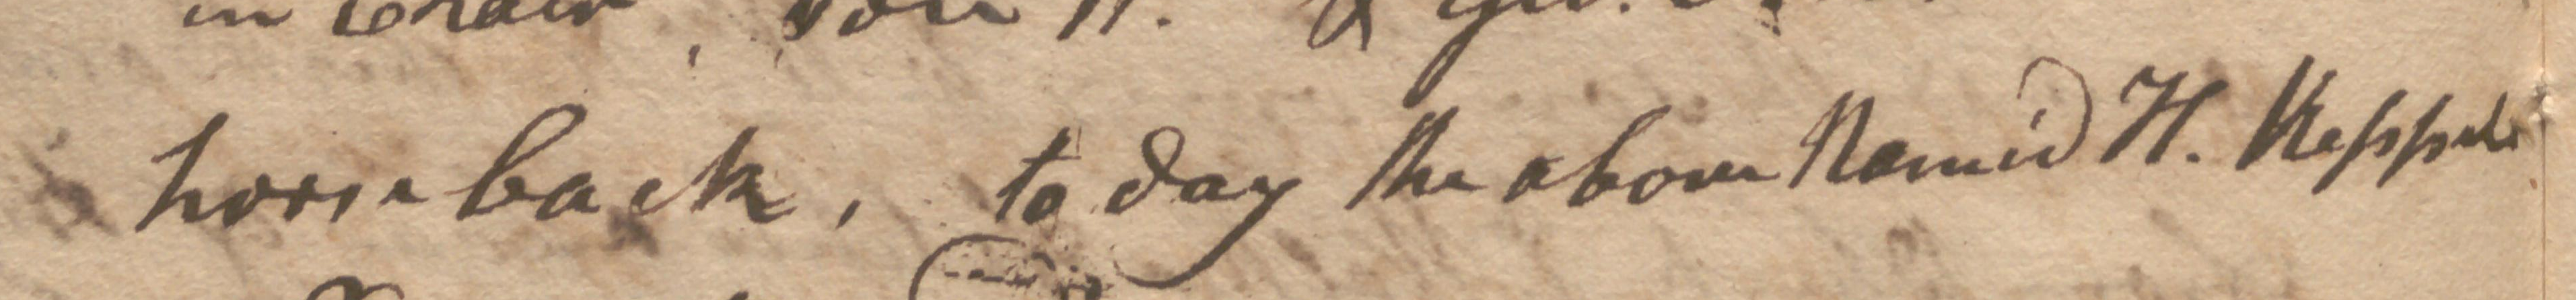horseback, to day the above Named H. Keppele
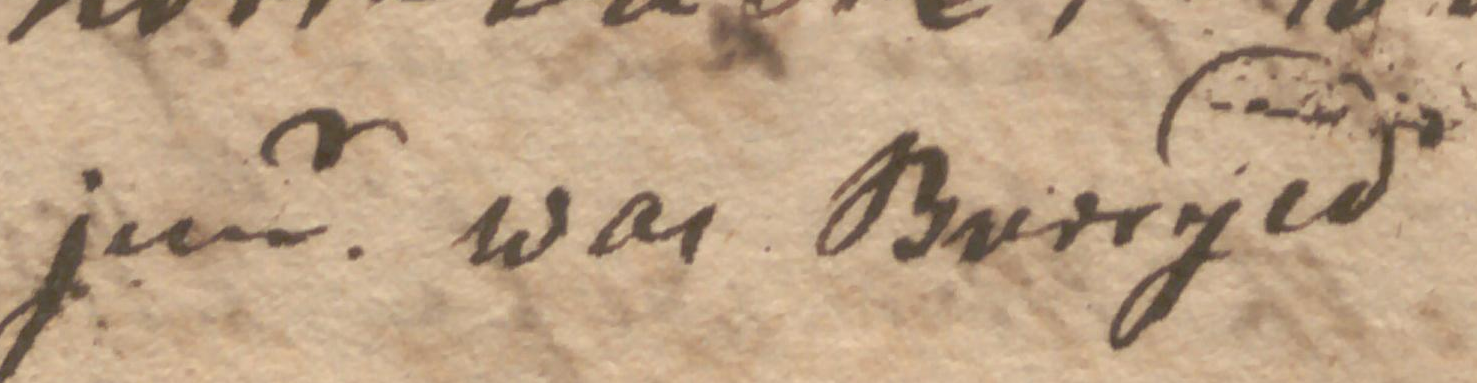jun^r. was Burryed
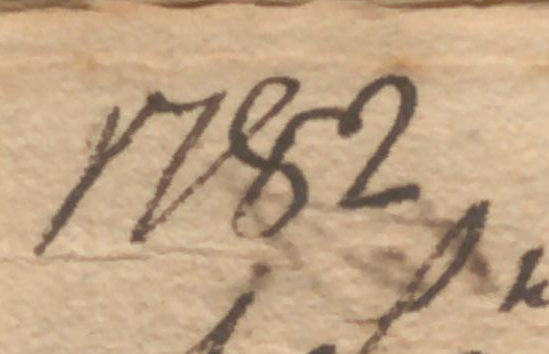1782
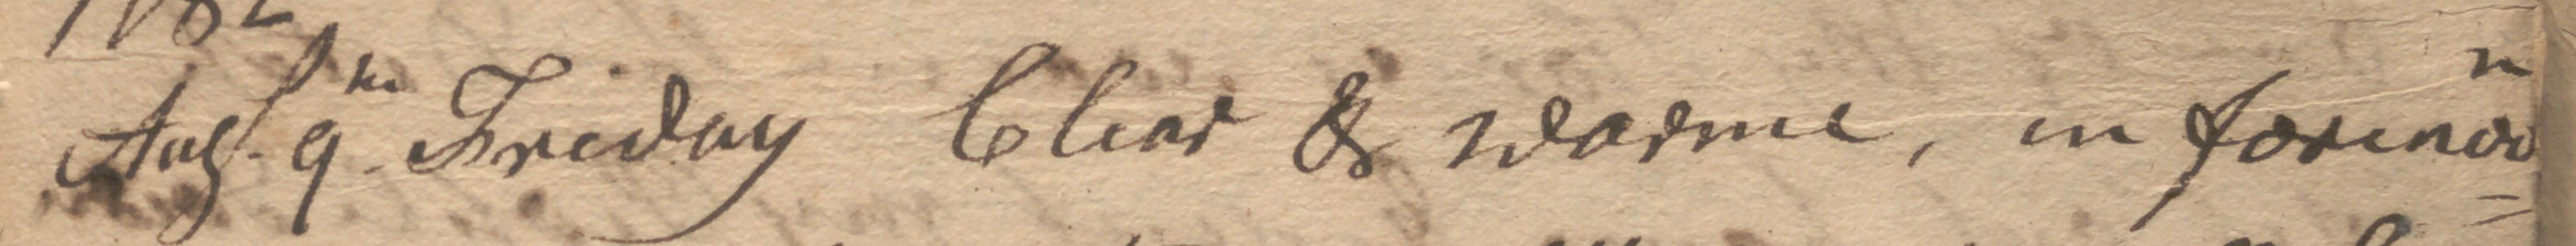Aug^t. 9^th Friday Clear & warme, in forenoo^n
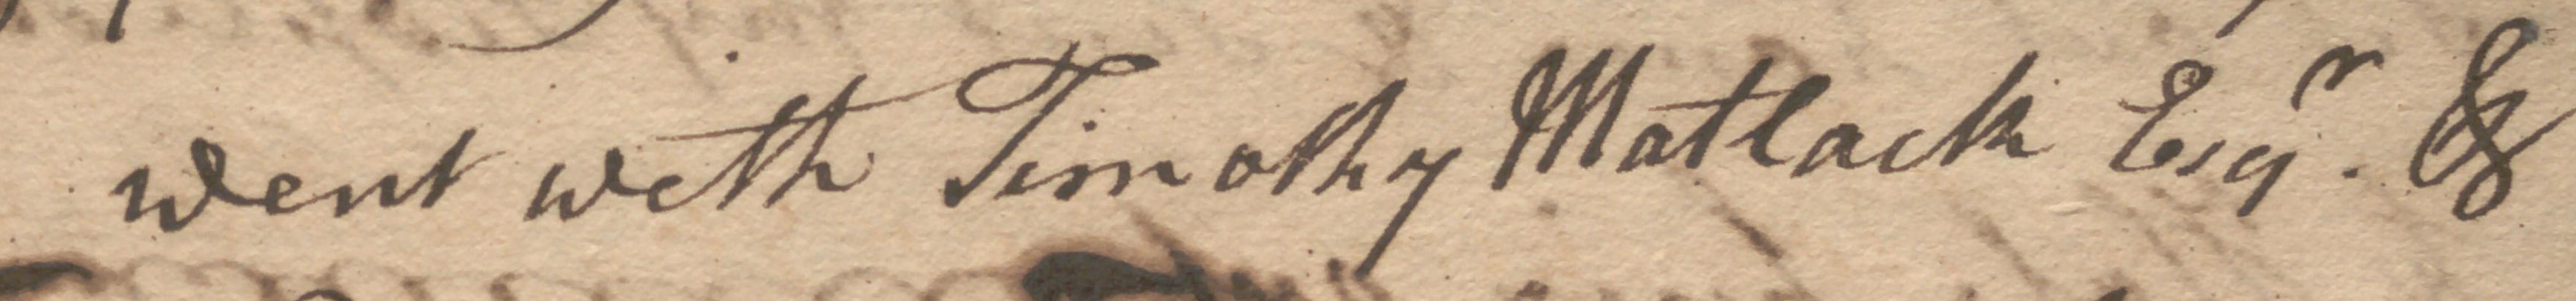went with Timothy Matlack Esq^r. &
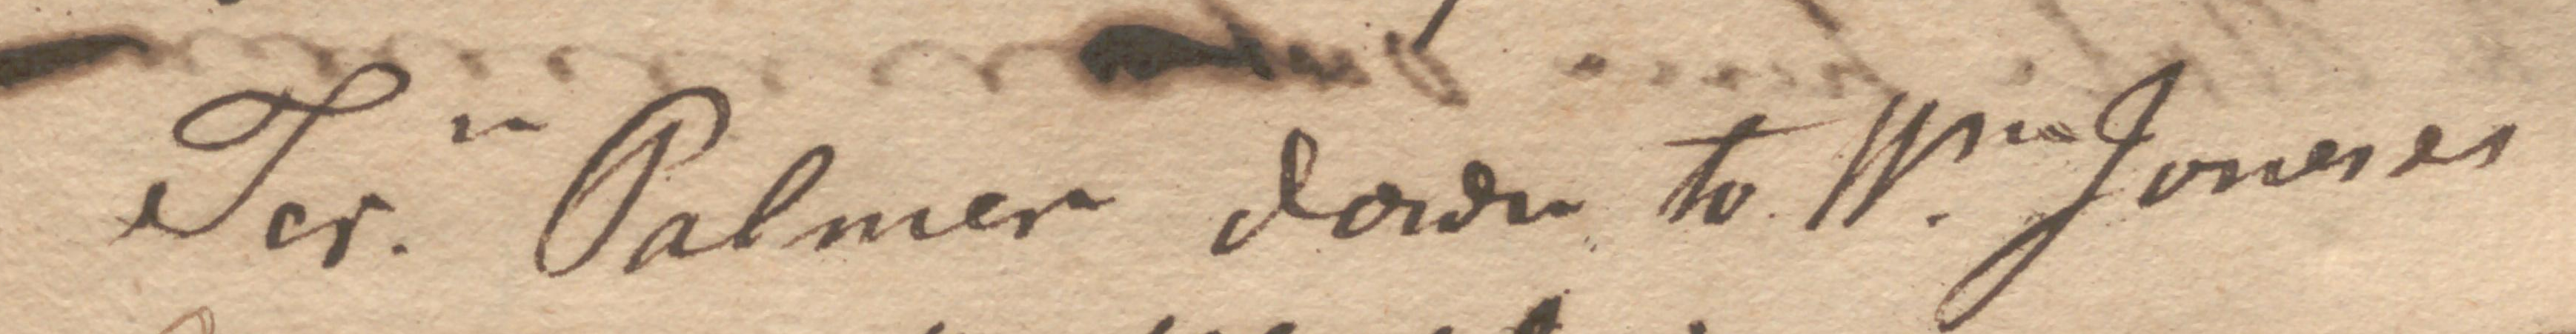Ter. Salmer down to W^m. Joneses
